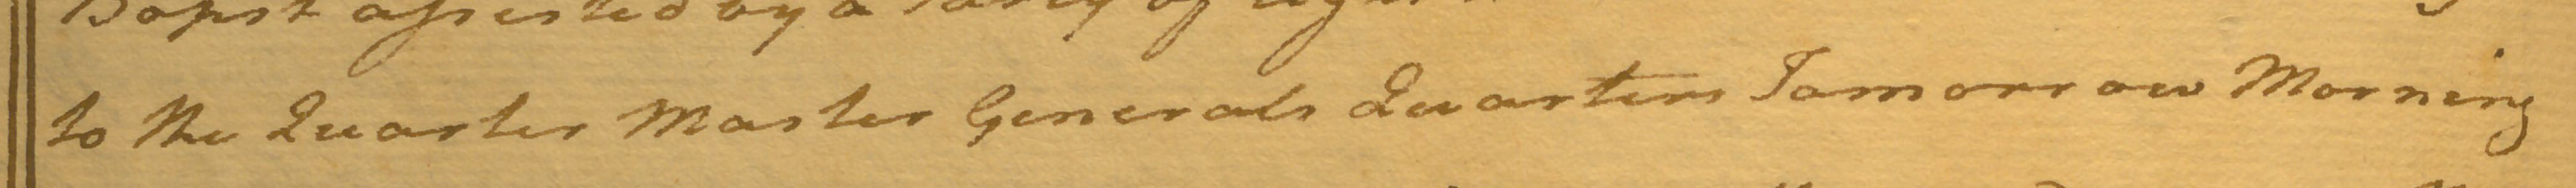to the Quarter Master Generals Quarters Tomorrow Morning
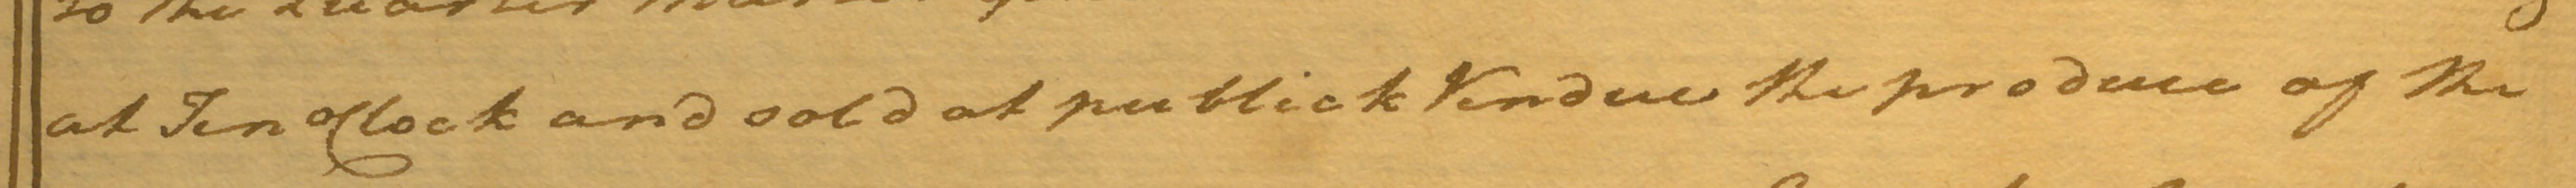at Ten ^oClock and sold at publick Vendue the produce of the
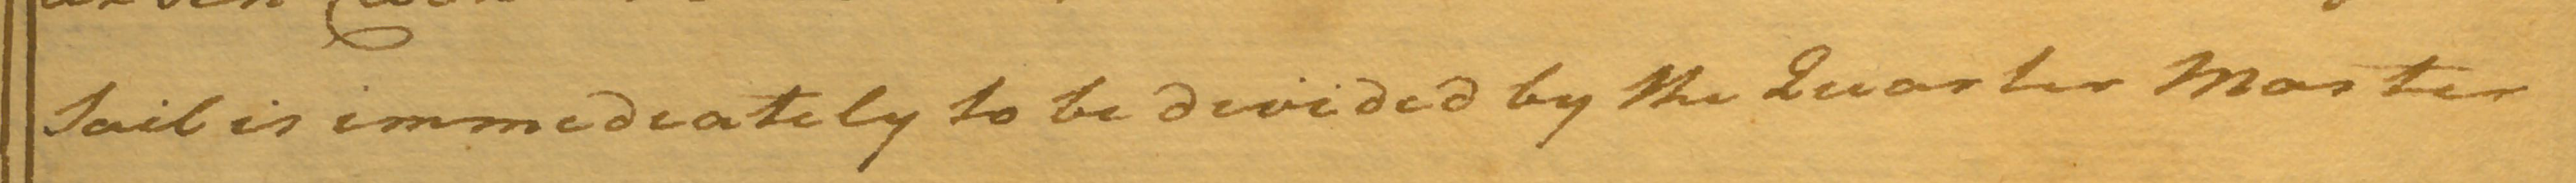sail is immediately to be divided by the Quarter Master
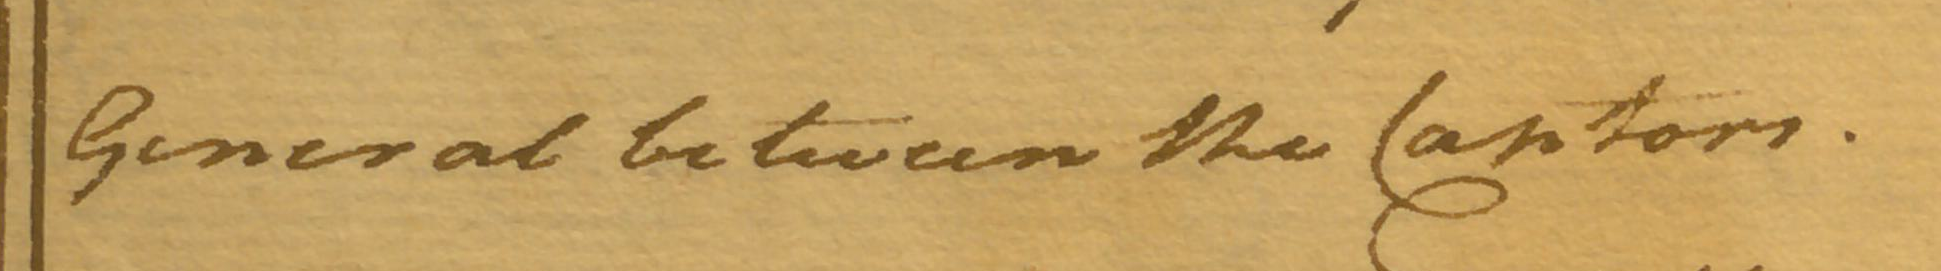General between the Captors.
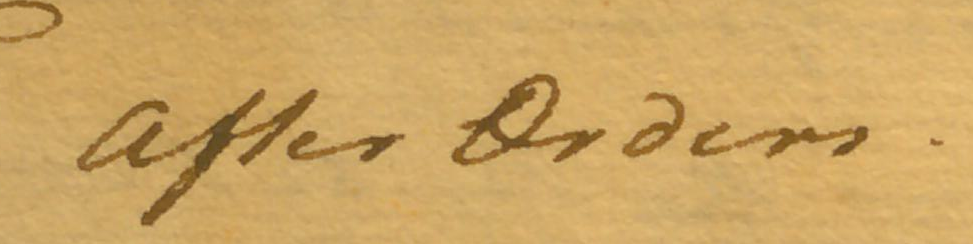After Orders
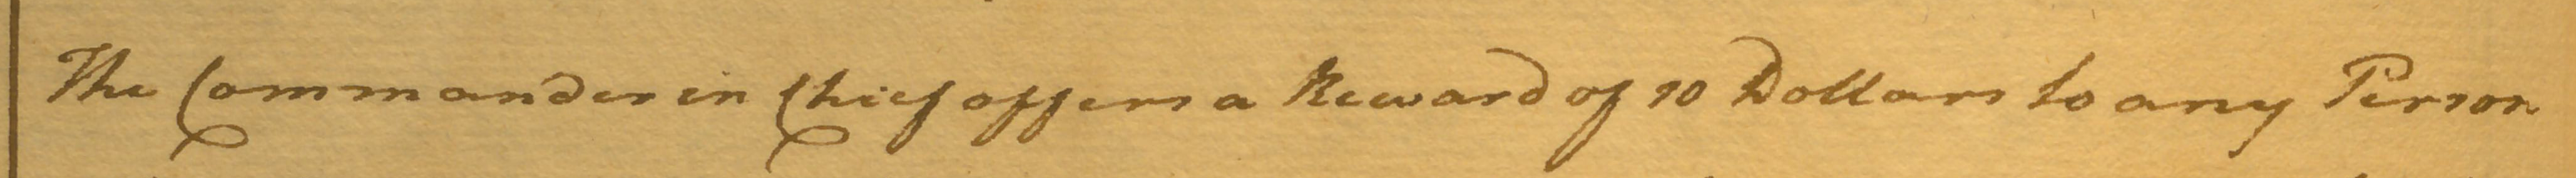The Commander in Chief offers a Reward of 10 Dollars to any Person
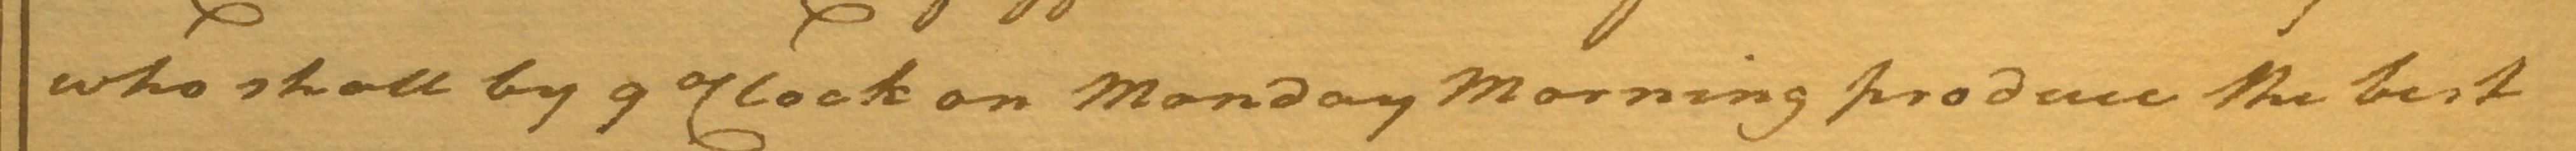who shall by 9 ^oClock on Monday Morning produce the best
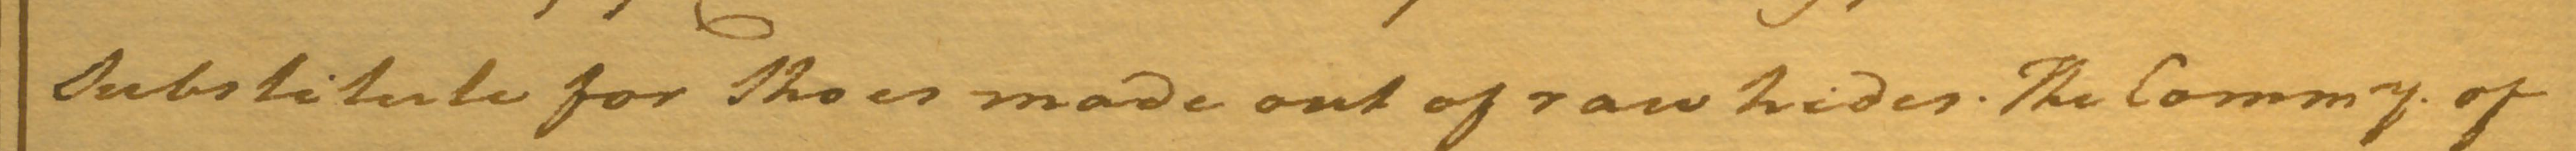substitute for Shoes made out of raw hides. The Comm^y of
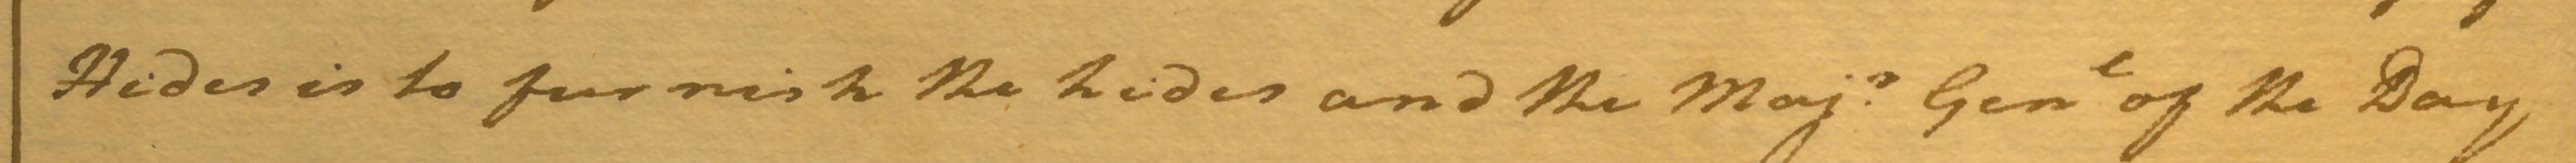Hides is to furnish the hides and the Maj^r. Gen^l of the Day
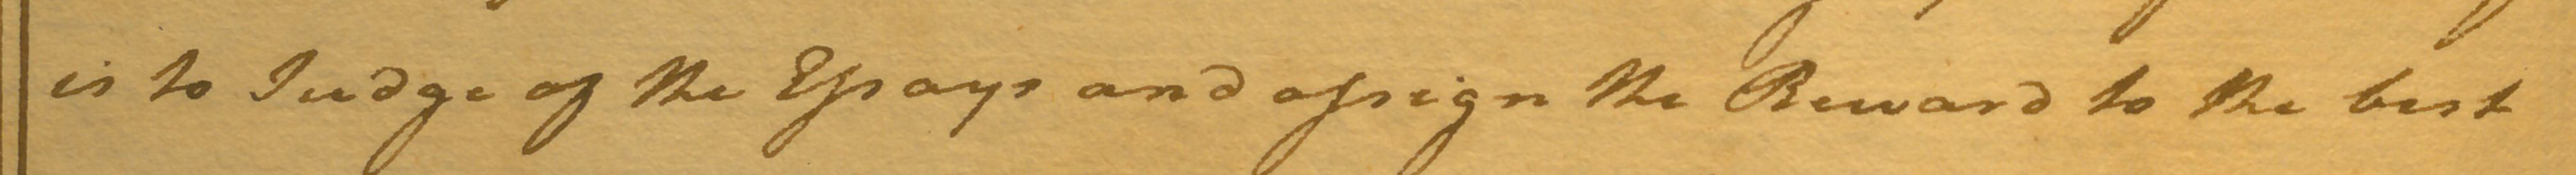is to Judge of the Essays and assign the Reward to the beset
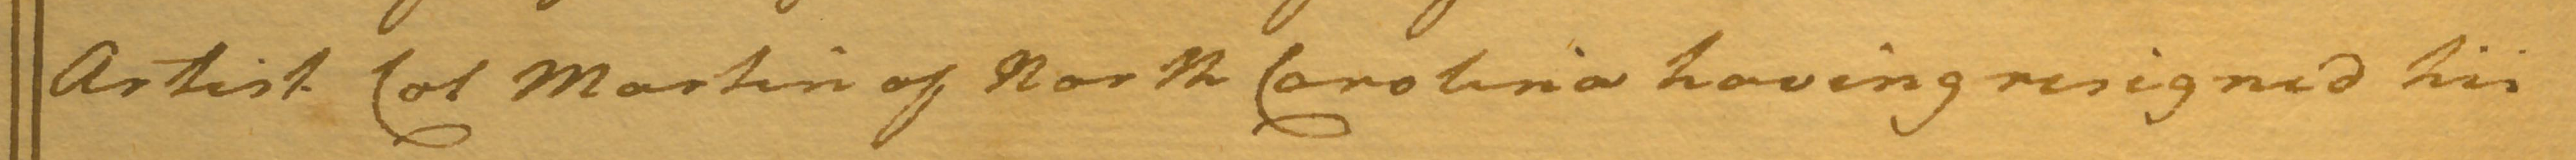Artist Col Martin of North Carolina having resigned his
